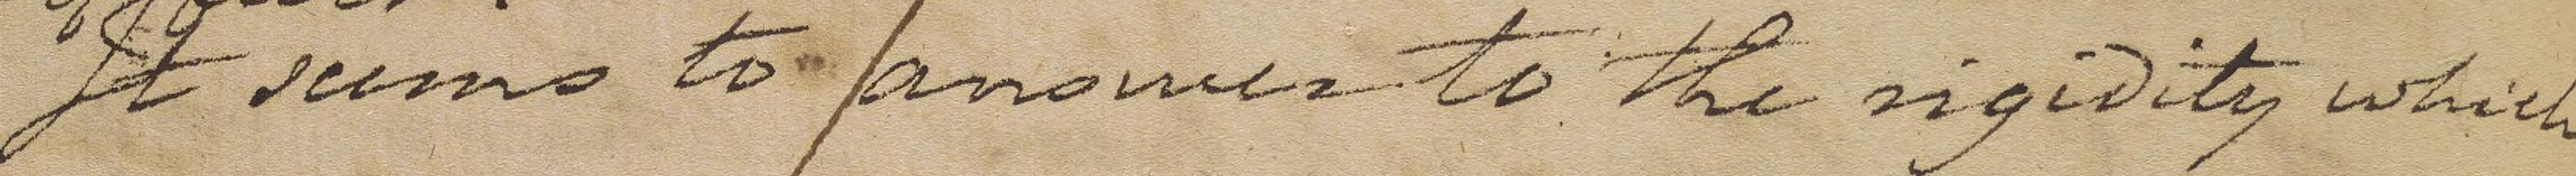V It seems to answer to the rigidity which
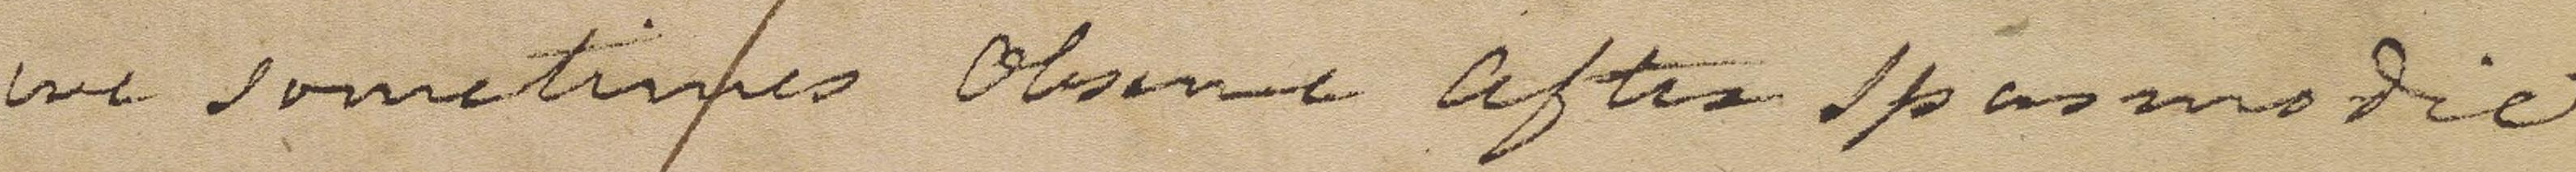we sometimes observe after Spasmodic
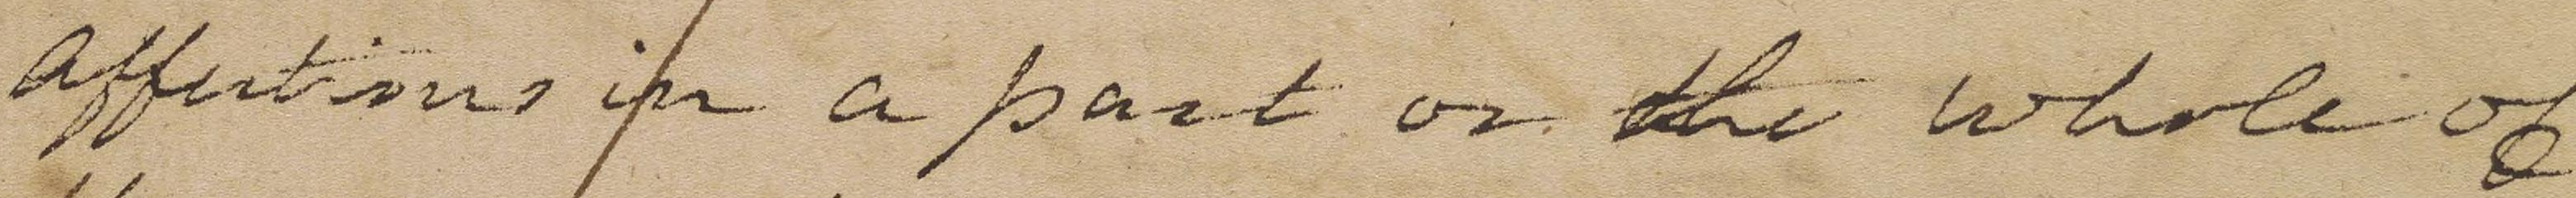affections in a part or the whole of
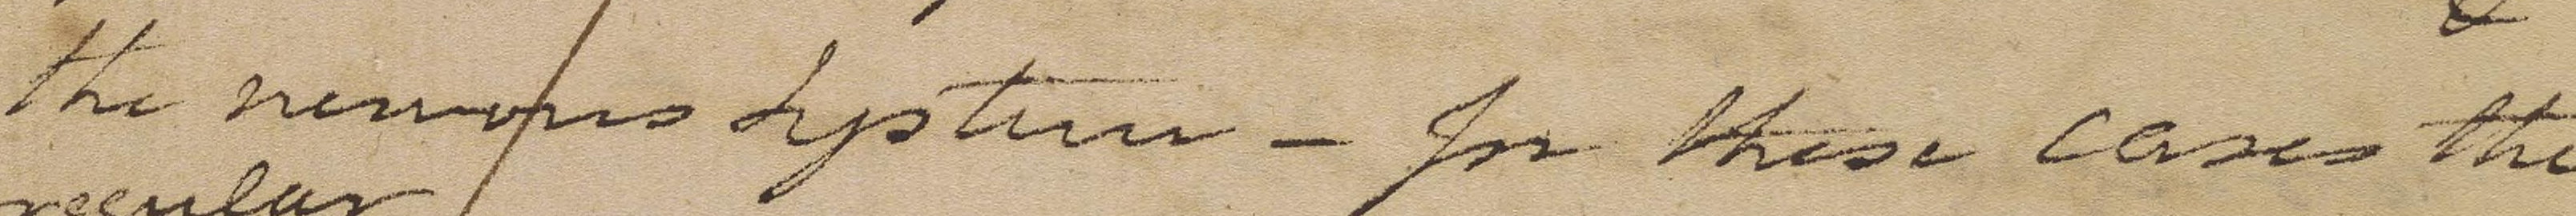the nervous system, In these cases the
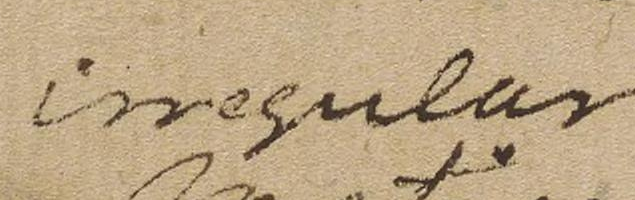irregular
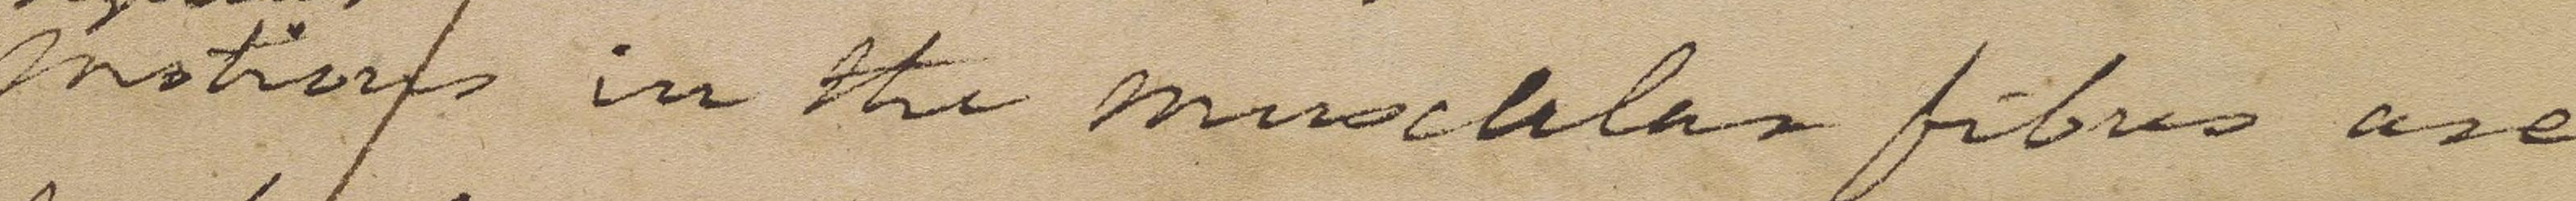motions in the muscular fibres are
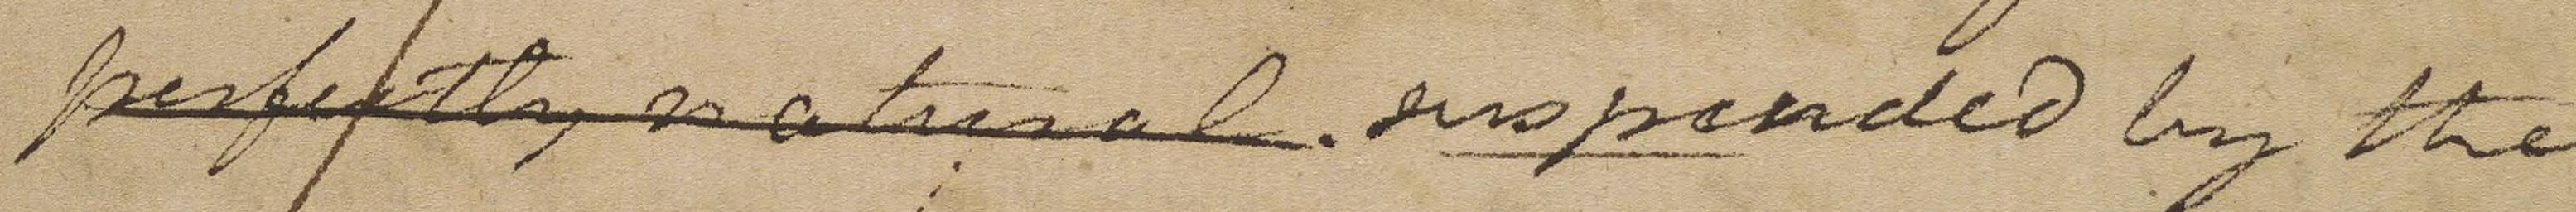[perfectly natural]. suspended by the
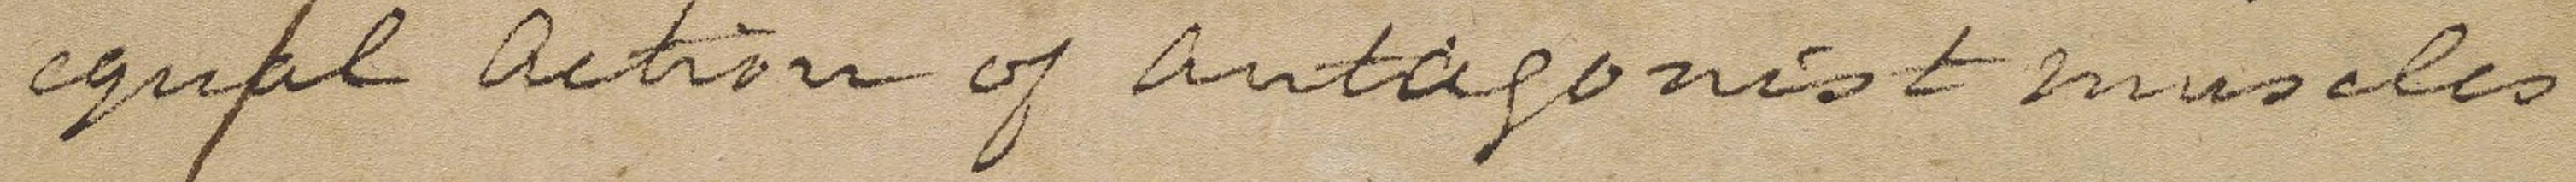equal action of antagonist muscles
